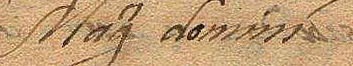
Mgri dominī
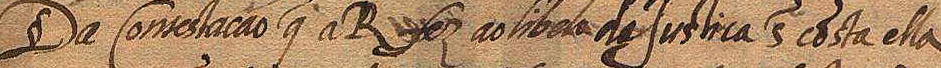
Da Contestacaõ q̄ a R fez ao libelo de Justica s̄ cōsta ella
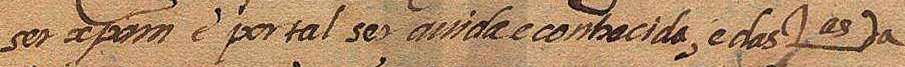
ser xpām e por tal ser auida e conhecida, e das tas da
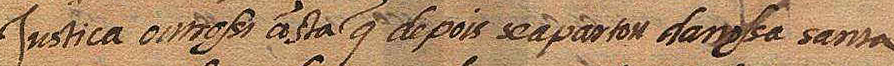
Justica outrossi cōsta q̄ depois se apartou da nossa santa
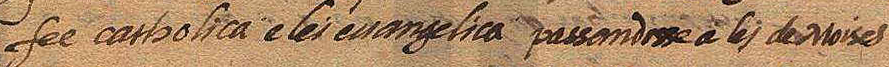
fee catholica e lei euangelica passandosse a lej de Moises
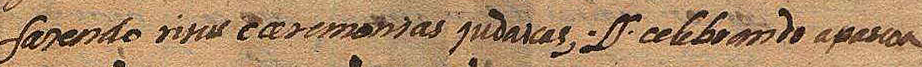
fazendo ritus e ceremonias judaicas, .ss. celebrando a pascoa
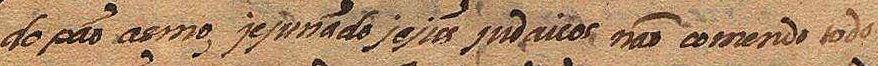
do pão asmo, jejunādo jejūs judaicos não comendo todo
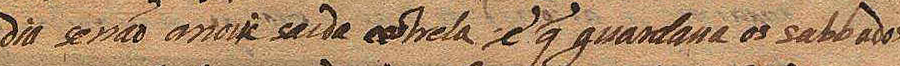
dia senão a noite saida a estrela e q̄ guardaua os sabbados
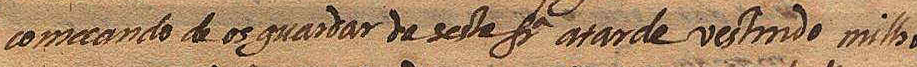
comecando de os guardar da sesta fra a tarde vestindo milho
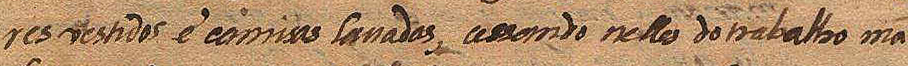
res vestidos e camisas lauadas, cessando nelles do trabalho mā
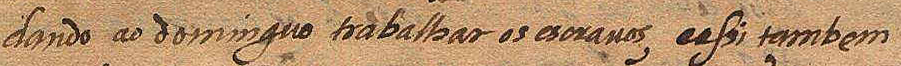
dando ao dominguo trabalhar os escrauos, e assi tambem
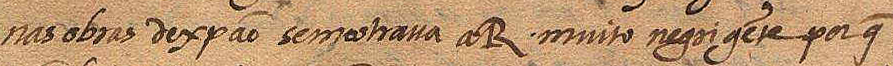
nas obras de xpão se mostraua a R. muito negrigēte porq̄
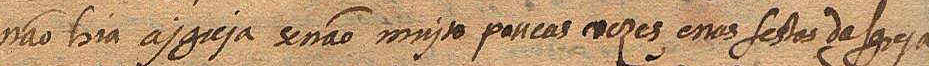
não hia a jgreja senão mujto poucas vezes, e nas festas da Jgreja
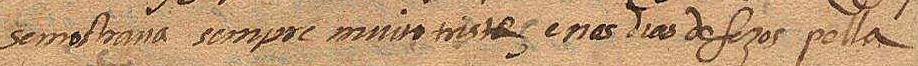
se mostraua sempre muito triste, e nos dias defezos pella
